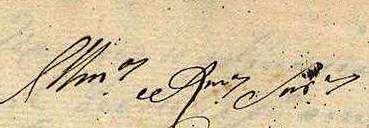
Illm.os e Rm.os S.res
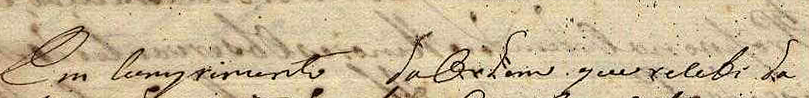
Em Cumprimento da Ordem que recebi da
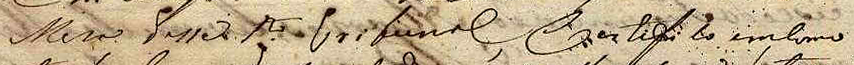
Meza desse s.to tribunal Certifico em como
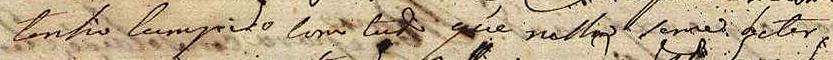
tenho Cumprido com tudo que nella se me deter
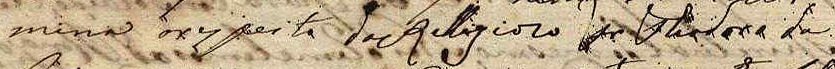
mina a respeito do Religiozo Fr Theodoro da
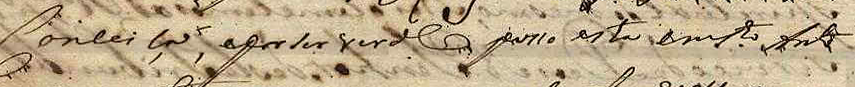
Conceiçaõ, e por ser verde passo esta em s.to Ant
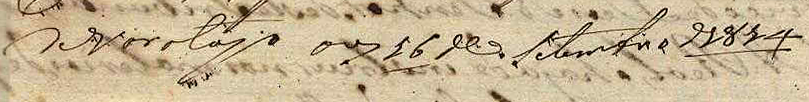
de Varatojo aos 16 de setembro d̄ 1814
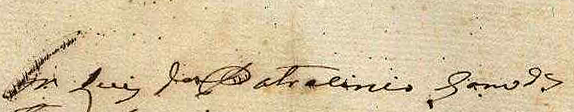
Fr. Luis do Patrocinio Gam des
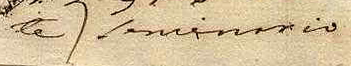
te seminario
